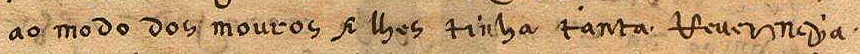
ao modo dos mouros e lhes tinha tanta Reuerencya
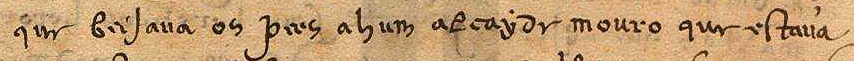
que beiJaua os pees a hum alcayde mouro que estaua
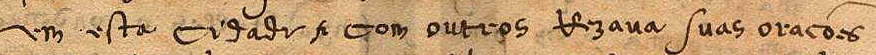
em esta Cidade e com outros Rezaua suas orações
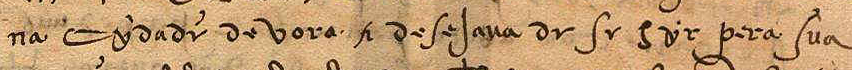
na Cydade devora e deseJaua de Se hyr pera Sua
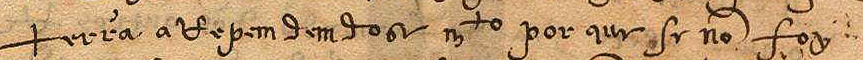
terra aRepemdemdose mto porque Se n̄o foy
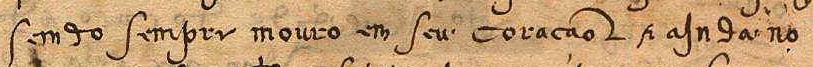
Semdo Sempre mouro em Seu coração e aJnda no
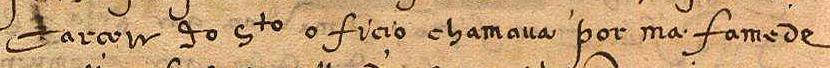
Carcere do Sto oficio chamaua por mafamede
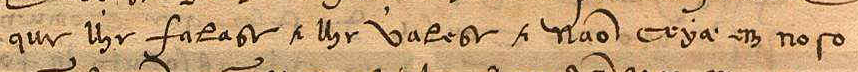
que lhe falase e lhe Valese e não crya em noso
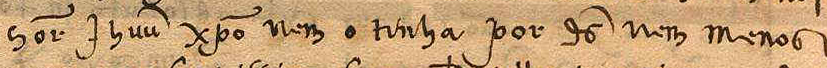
Sōr Jhuū xpō nem o tinha por ds̄ nem menos
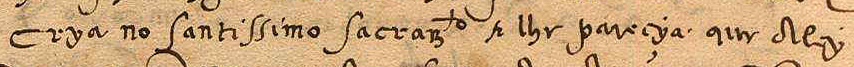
crya no Santissimo Sacramto e lhe parecya que A ley
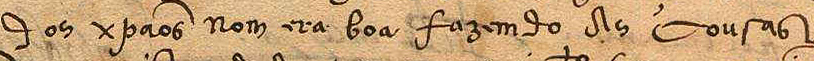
dos xpaõs nom era boa fazemdo As Cousas
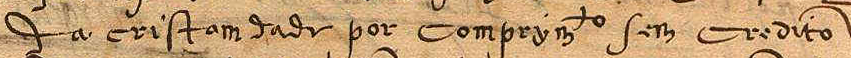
da cristamdade por Comprymto Sem Credito
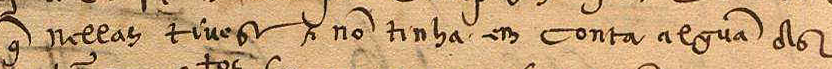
q̄ nellas tiuese e nō tinha em Conta alguā As
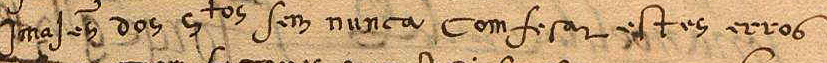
JmaJēs dos Stos Sem nunca Comfesar estes erros
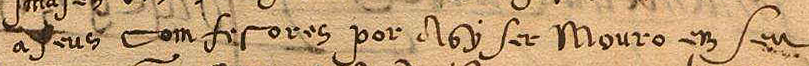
a seus Comfesores por Asy Ser Mouro em Seu
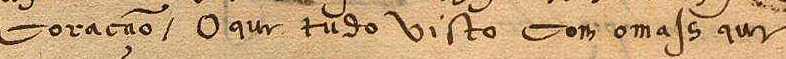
Coração / O que tudo Visto Com o maJs que
